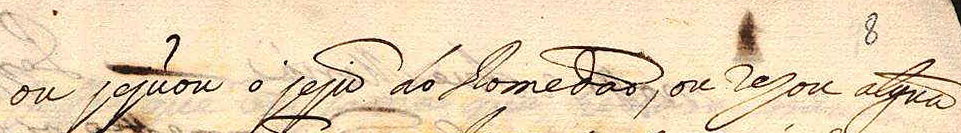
ou jejūou o jejū do Romedaõ, ou rezou alguā
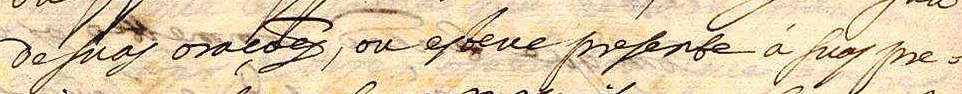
de suas orações, ou esteue presente á suas pre
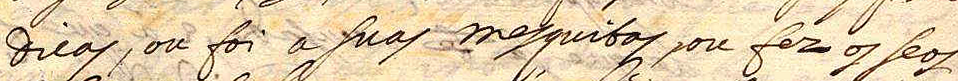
dicas, ou foi a suas mesquitas, ou fez os seos
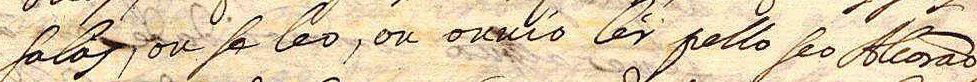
salas, ou se leo, ou ouuio ler pello seo Alcorão
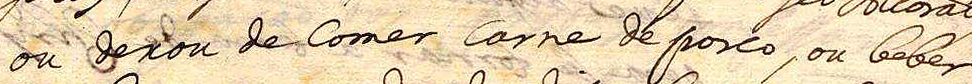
ou dexou de comer carne de porco, ou beber
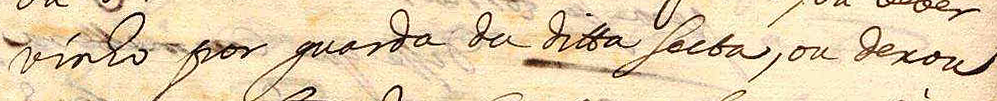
vinho por guarda da ditta secta, ou dexou
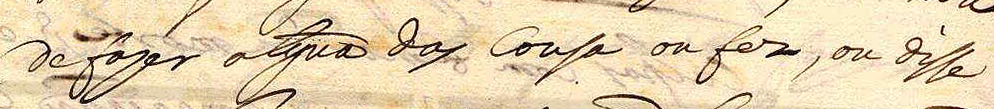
de fazer algūa das cousa ou fez, ou disse
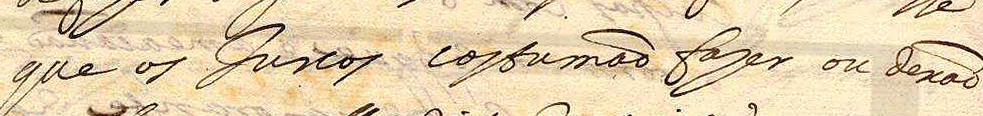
que os turcos costumão fazer ou derão
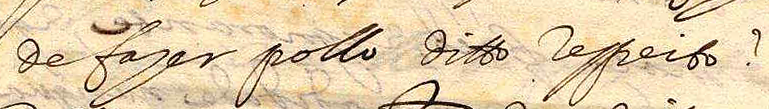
de fazer pollo ditto respeito?
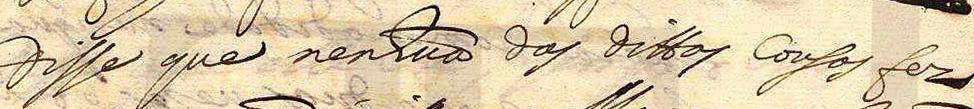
Disse que nenhuā das dittas cousas fez
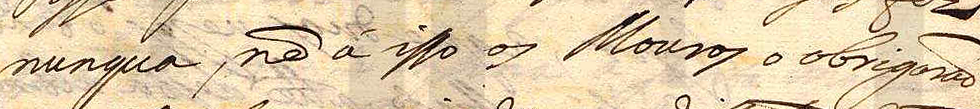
nunqua, nē á isso os Mouros e obrigaraõ
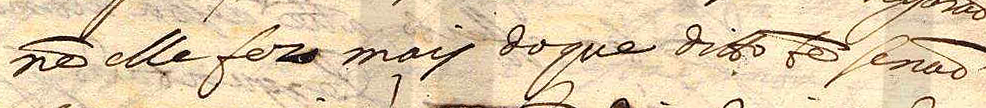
nē elle fez mais do que ditto tē senaõ
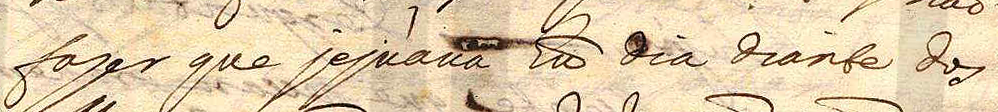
fazer que jejūaua hū dia diante dos
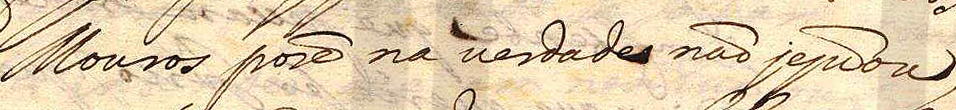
Mouros porē na uerdade naõ jejūou
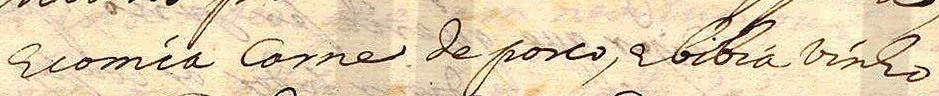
E comia carne de porco, E bibia vinho
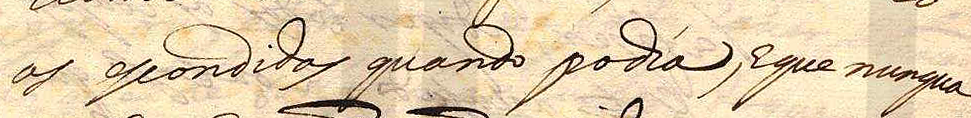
as escondidas quando podia, E que nunqua
